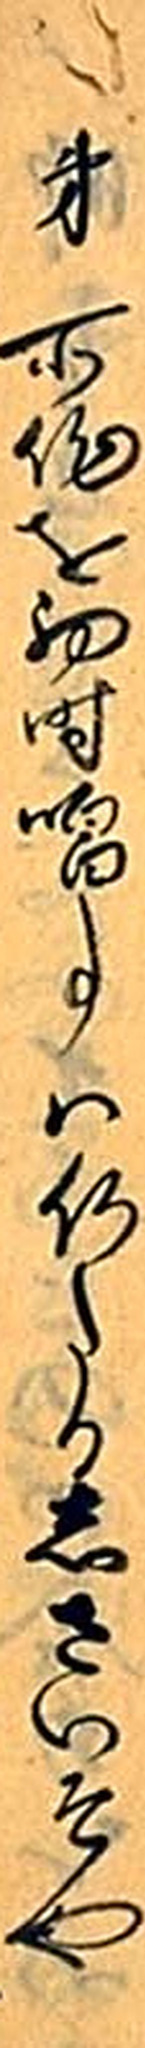弟所作を初時唱事は何たるしさいそや
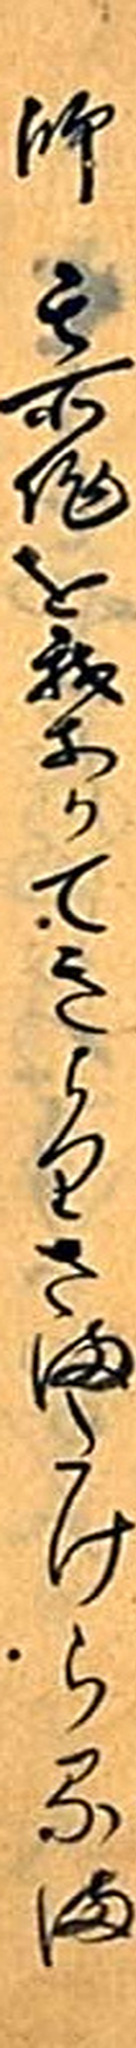師其所作を我等かてきよりさまたけらるま
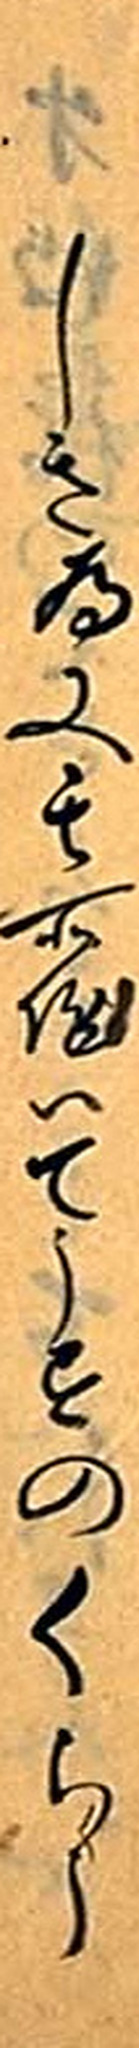しき為又其所作はてうすのくらう
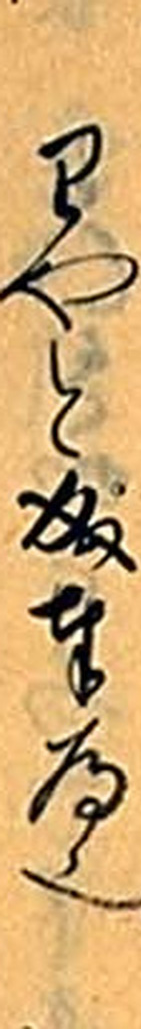りやと成奉為也
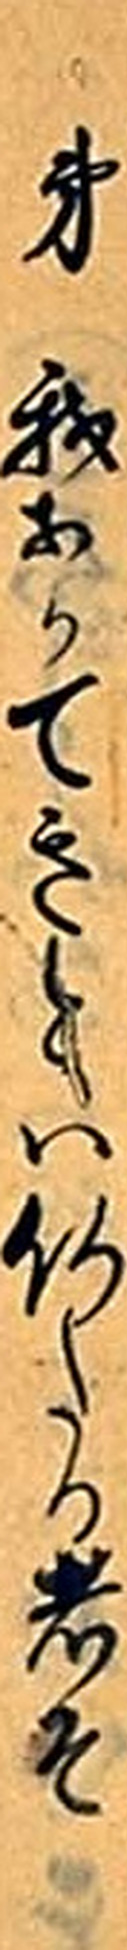弟我等かてきとは何たる者そ
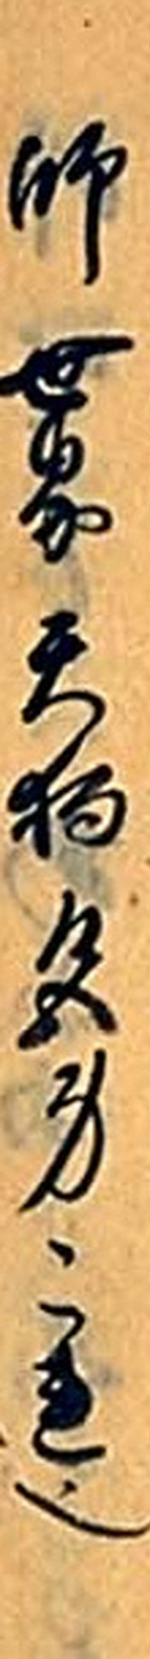師世界天狗色身これ也
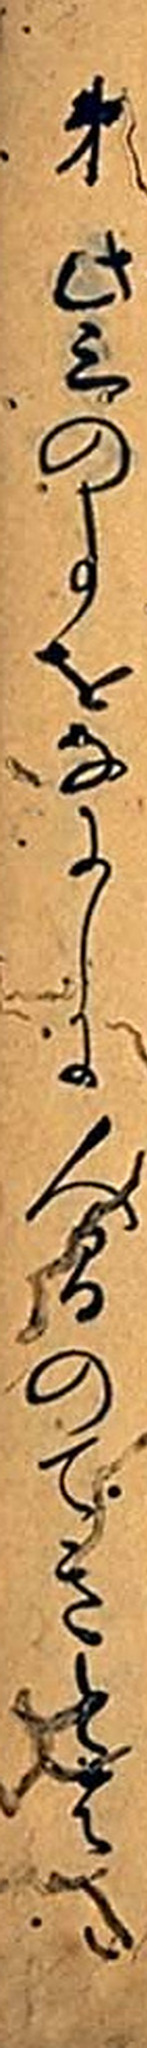弟此三の事をなにしに人間のてきとは

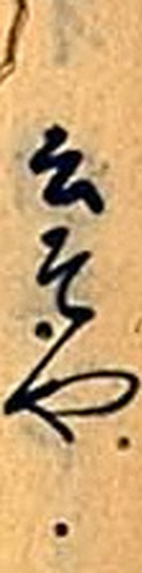云そや
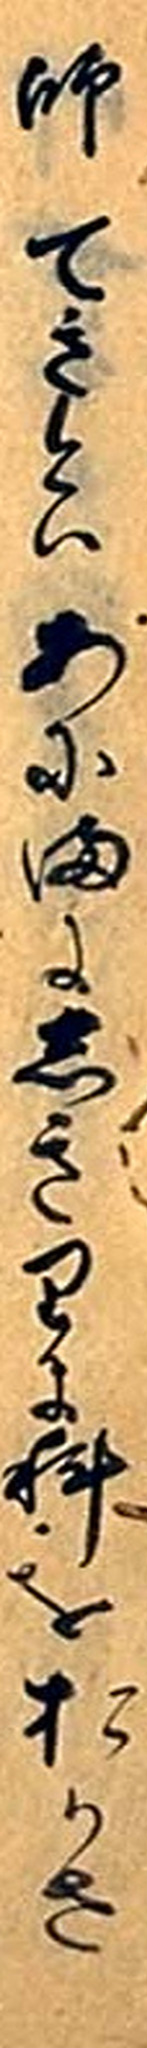師てきとはあにまにしきりに科をおかさ
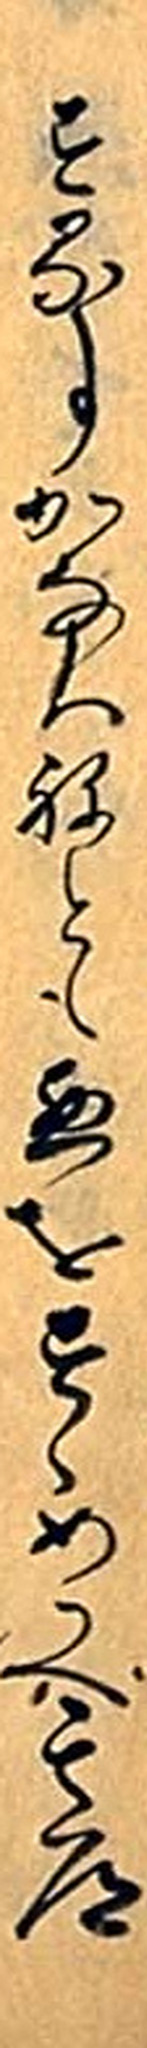する事かなはねとも悪をすゝめ又其道
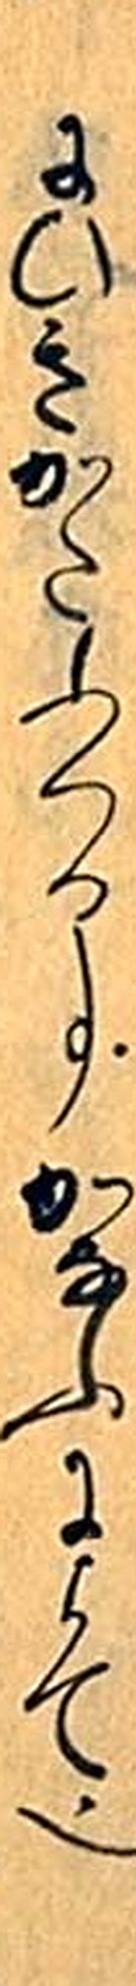にひきかたふくる事かなふによて也
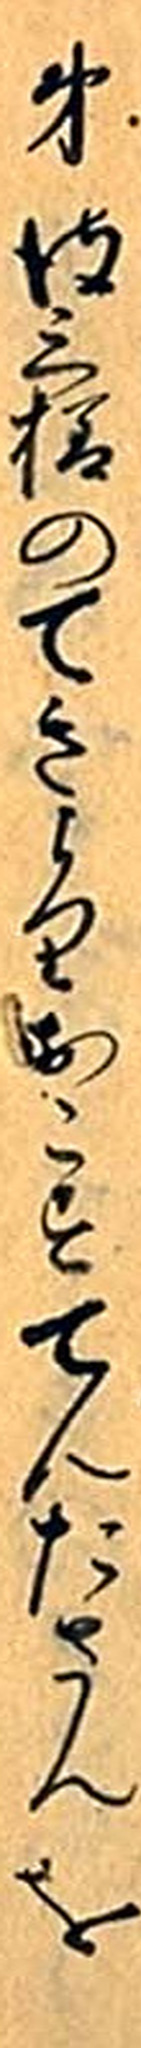弟彼三様のてきよりおこすてんたさんを
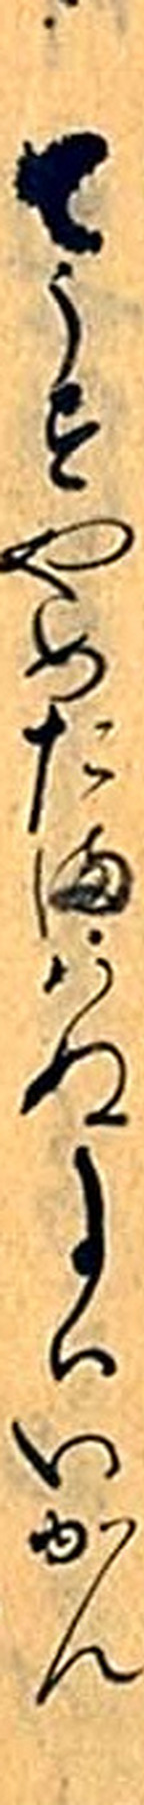てうすやめたまはぬ事はいかん
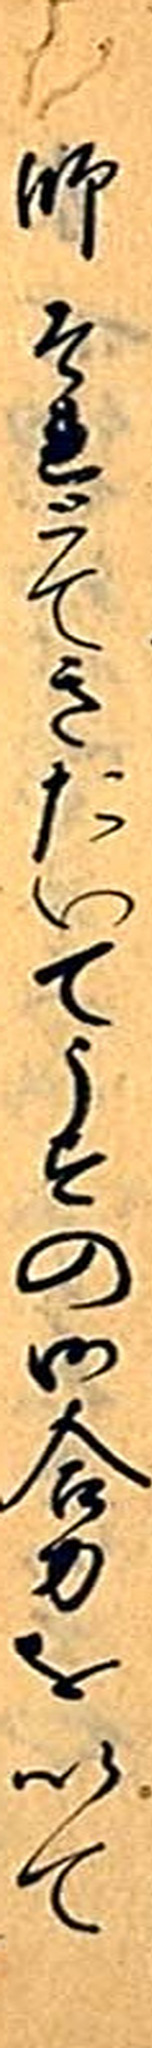師それとてきたいてうすの御合力を以て
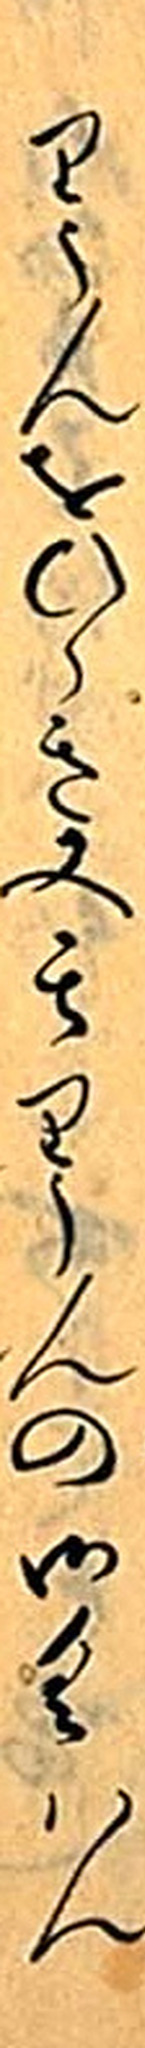りうんをひらき又其りうんの御くはん
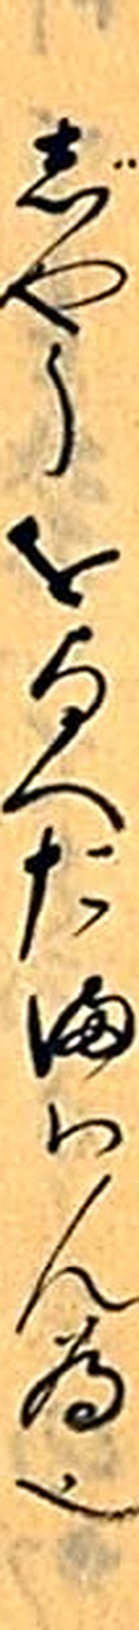じやうを与へたまはん為也
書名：ドチリナ・キリシタン
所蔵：東京大学総合図書館 / General Library in the University of Tokyo
